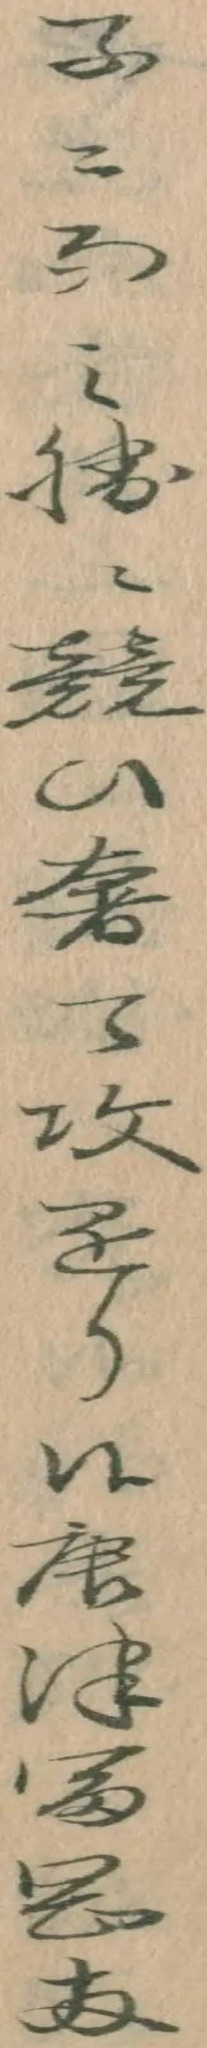子に而之勝に競ひ奢て攻懸り候唐津冨岡両
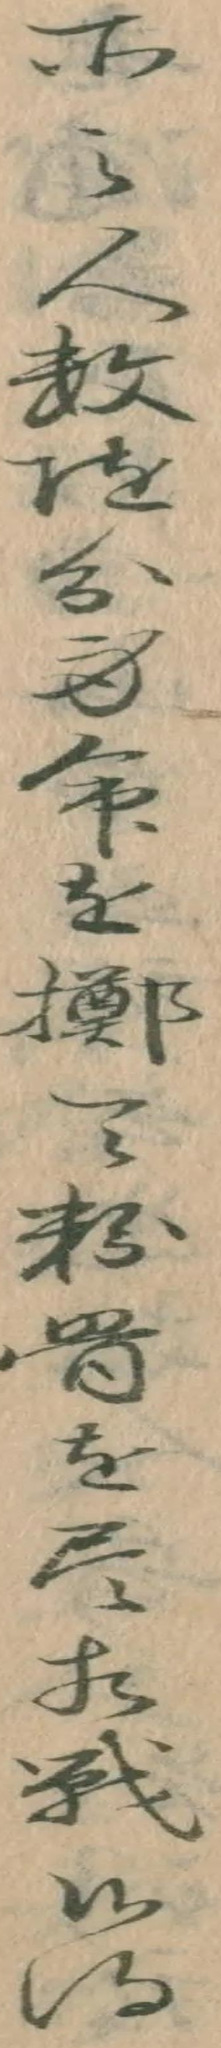所之人数随分身命を擲て粉骨を尽相戦候得
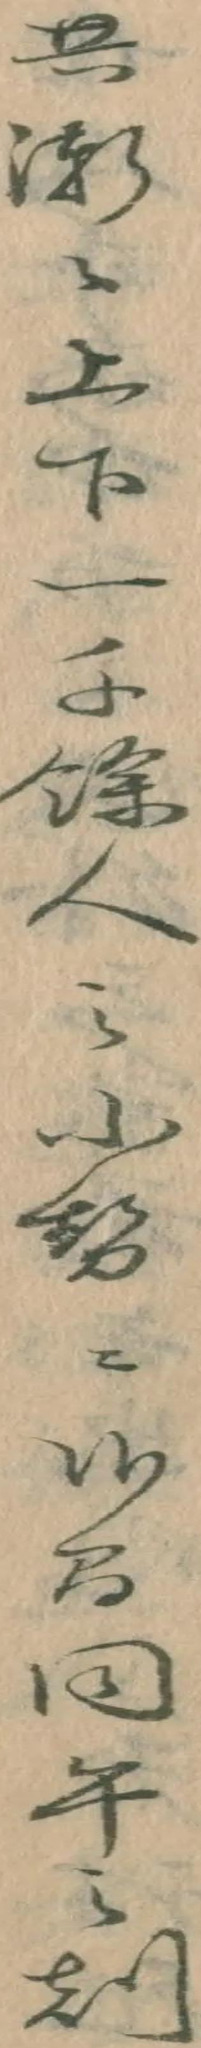共漸々上下一千余人之小勢に候間同午之刻
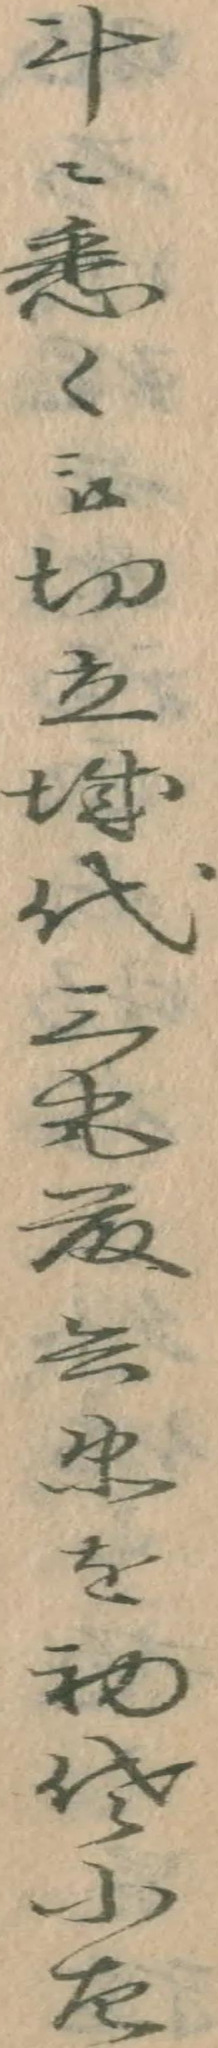斗に悉く被切立城代三宅藤兵衛を初佐小左
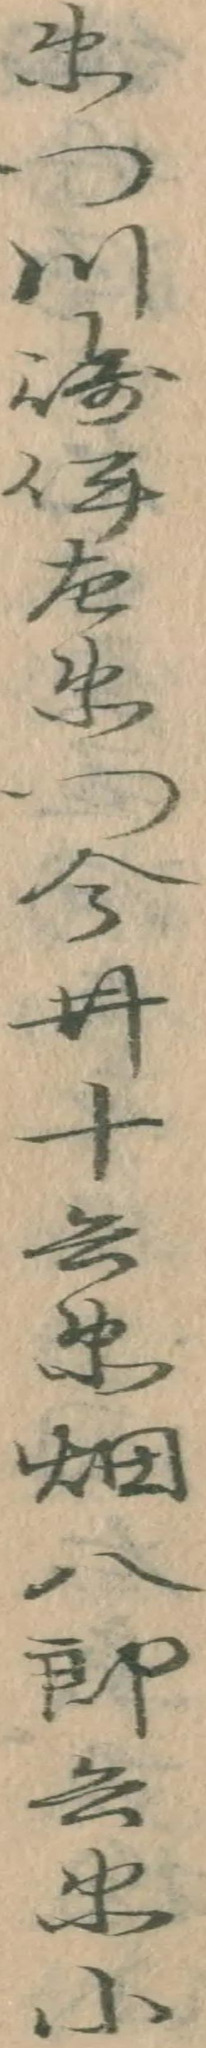衛門川崎伊左衛門今井十兵衛畑八郎兵衛小
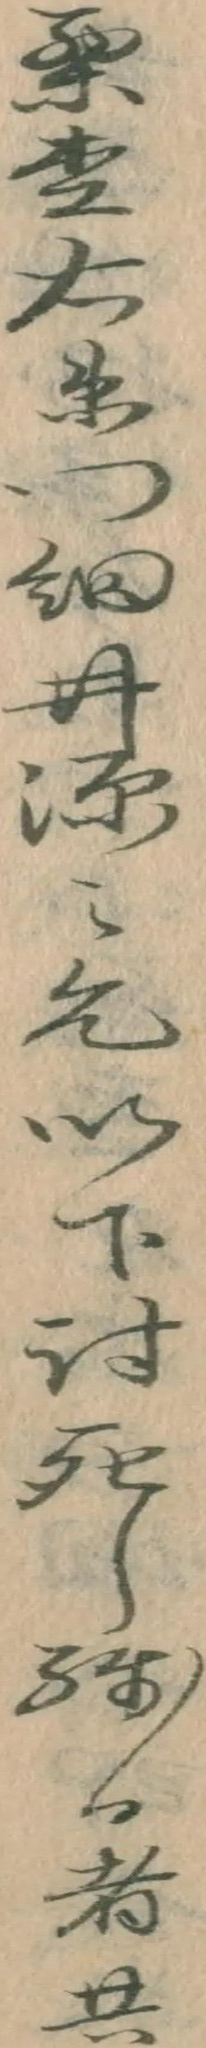栗杢右衛門細井源之允以下討死し残る者共
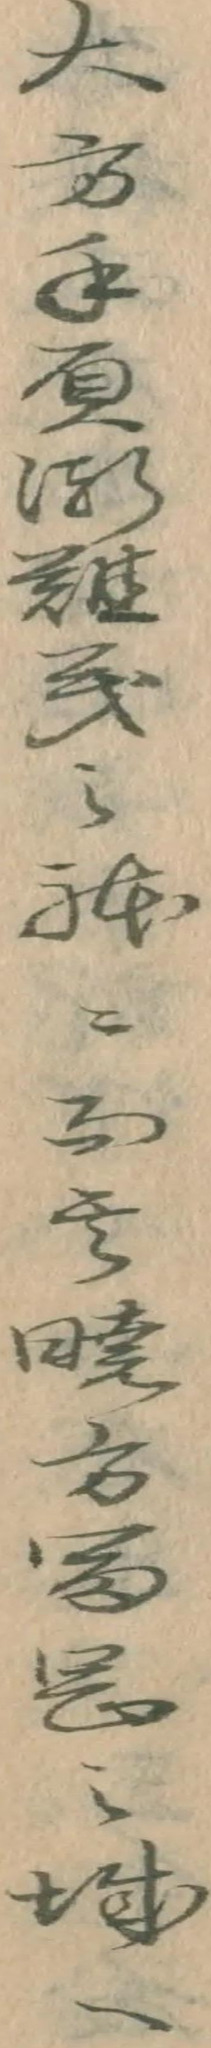大方手負漸難義之躰に而其暁方冨岡之城へ
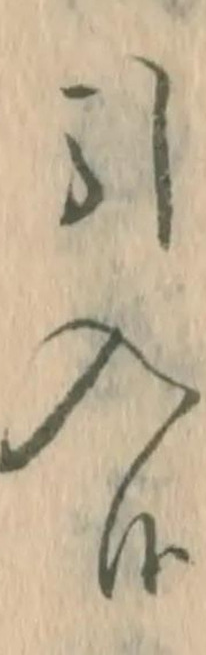引入候

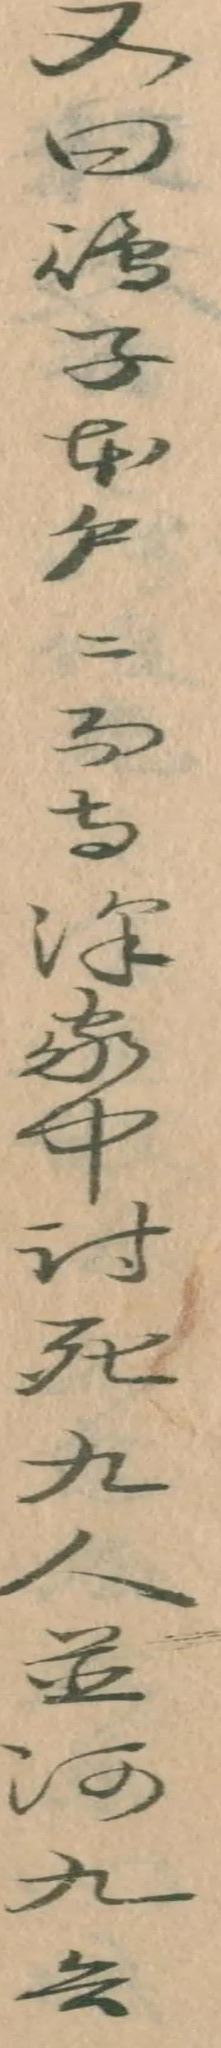又曰島子本戸に而寺沢家中討死九人並河九兵
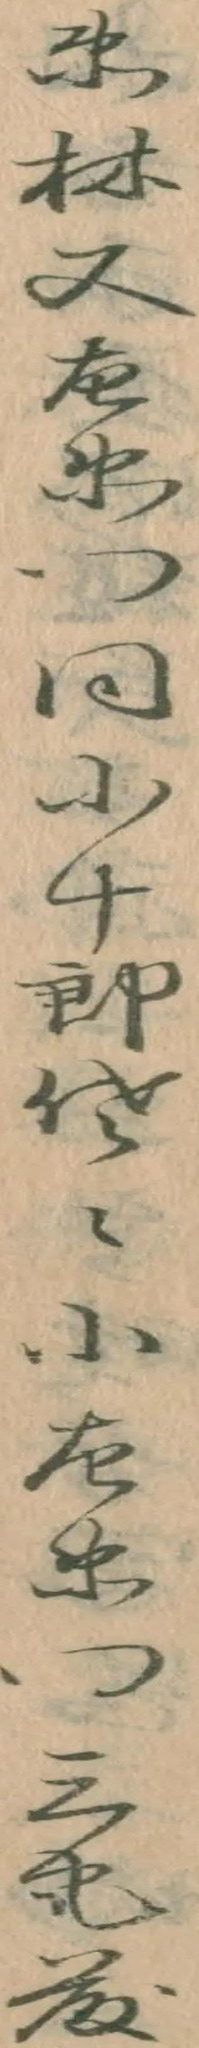衛林又左衛門同小十郎佐々小左衛門三宅藤
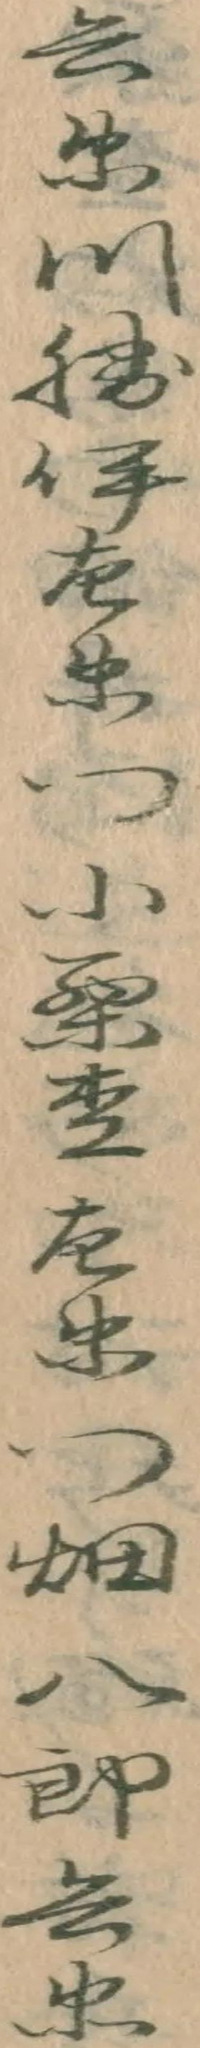兵衛川勝伊左衛門小栗杢左衛門畑八郎兵衛
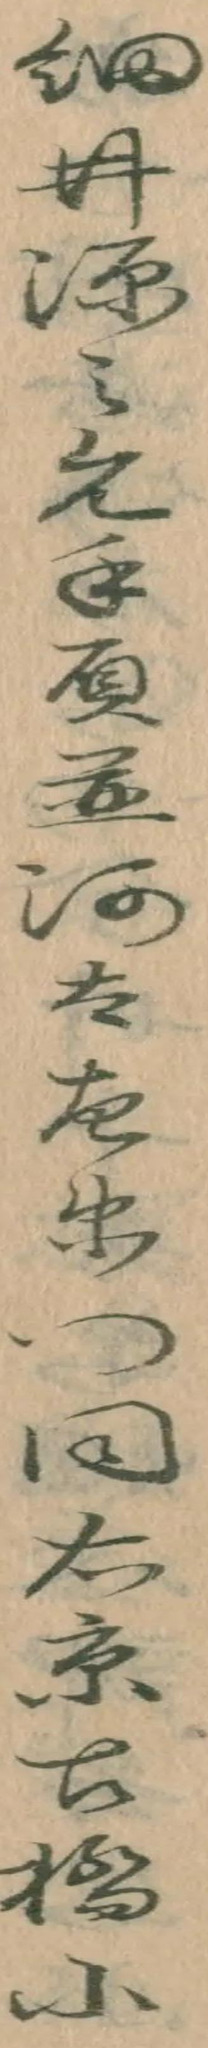細井源之允手負並河太左衛門同右京古橋小
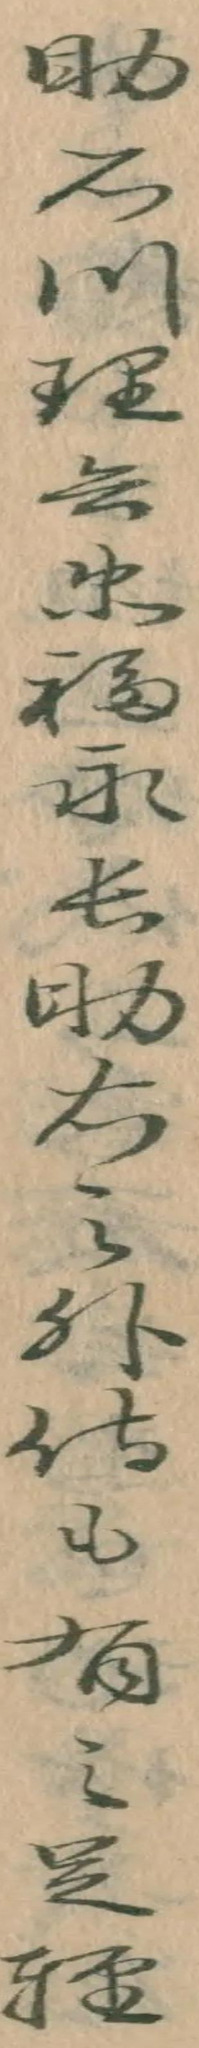助石川理兵衛福永長助右之外侍も有之足軽
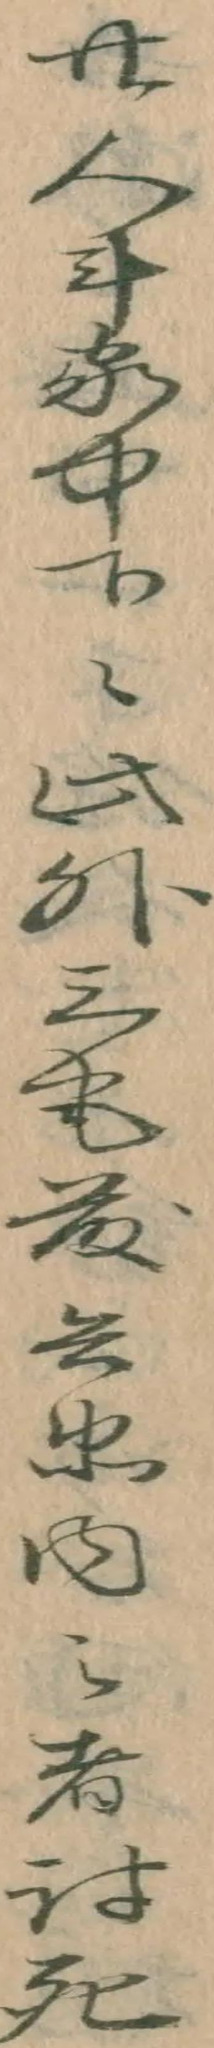廿人斗家中下々此外三宅藤兵衛内之者討死
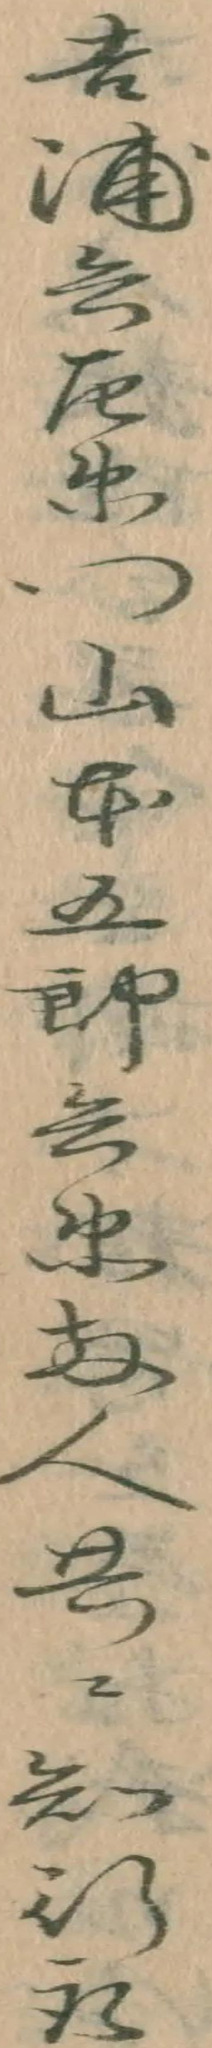吉浦兵左衛門山本五郎兵衛両人共に知行取
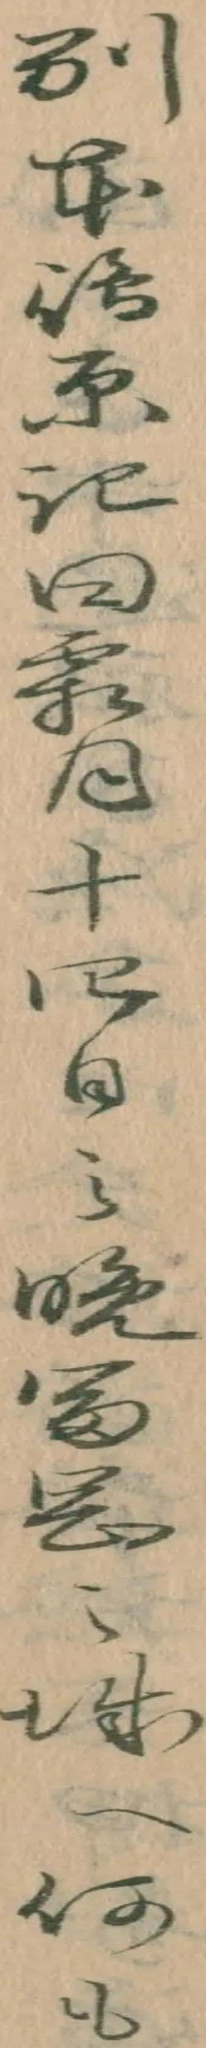別本島原記曰霜月十四日之晩冨岡之城へ何も
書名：切支丹御退治記 49巻. [2]
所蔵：国立国会図書館 National Diet Library, JAPAN
